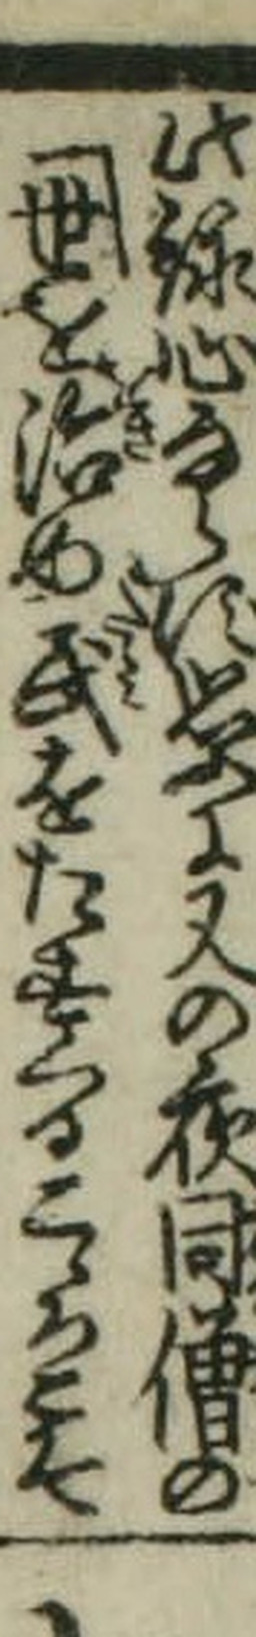〽世を治め民をたすくるこゝろこそ
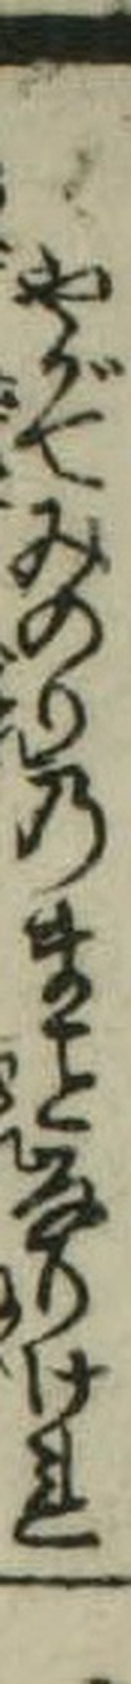やがてみのりのまことなりけれ
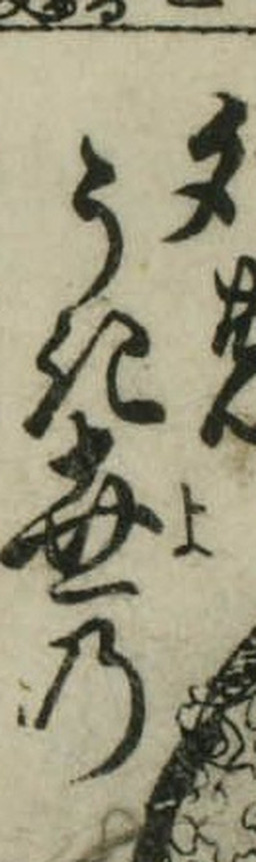うき世の
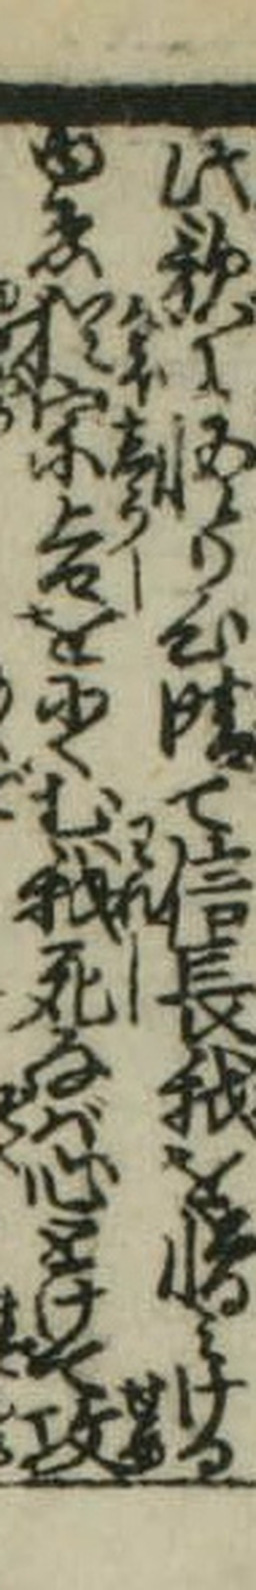ゆゑ猶宗旨をにくむ我死なば心とけて攻
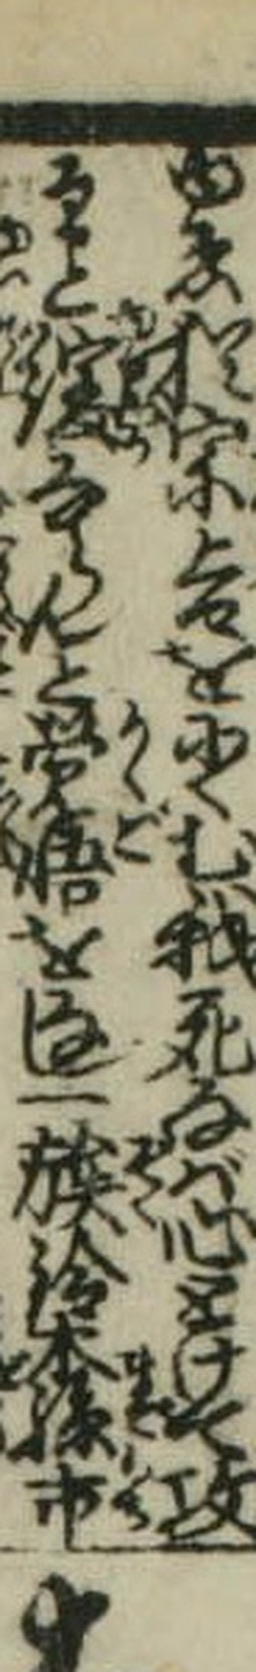ること緩ならんと覚悟をなし一族鈴木孫市
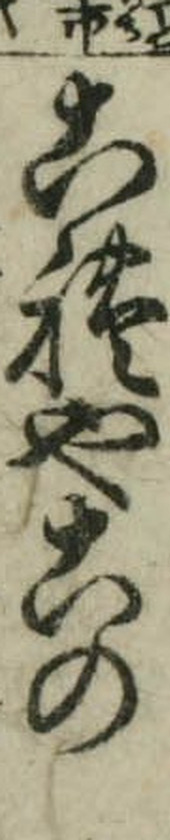これやこの
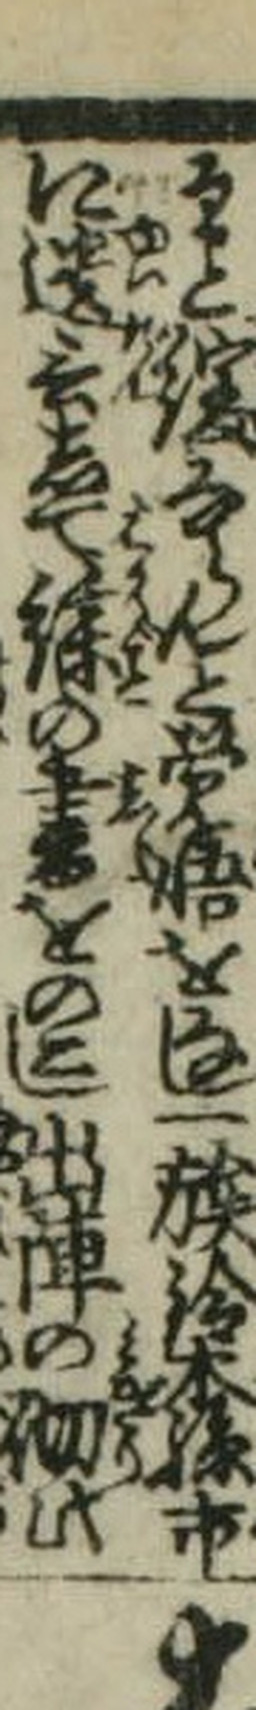に遺言して謀の書をのこし出陣の砌此
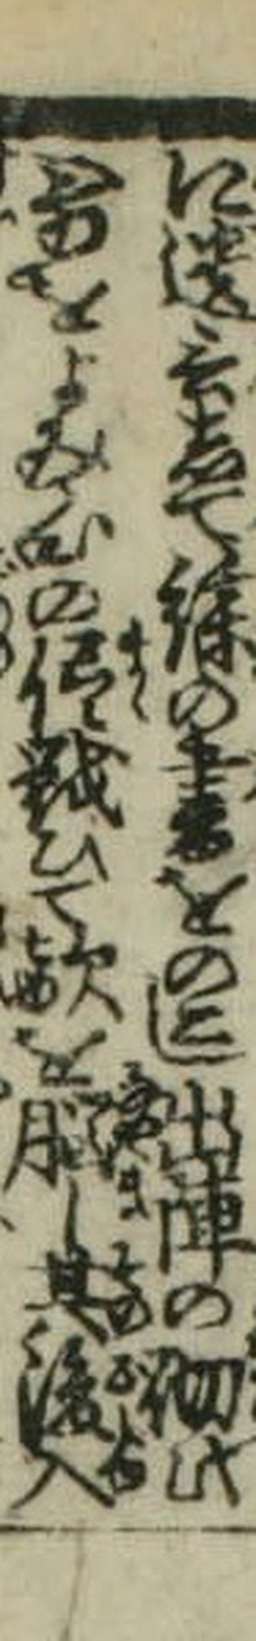歌をよみ心の侭戦ひて敵を悩し其後入
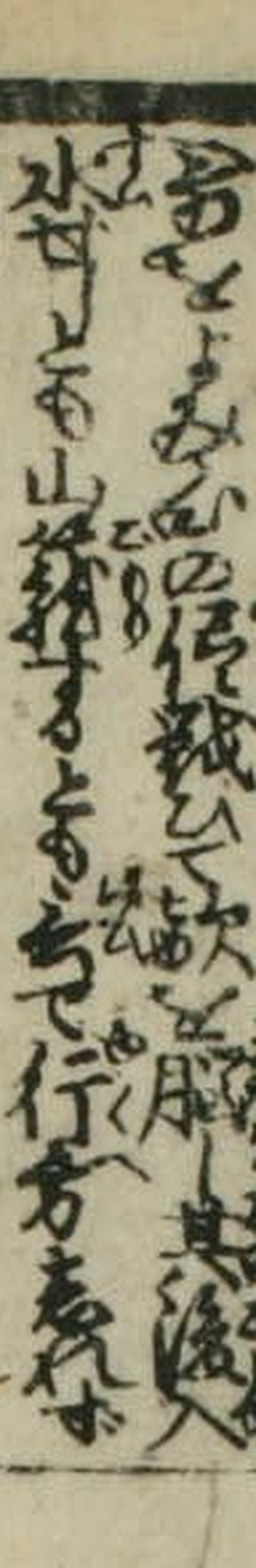水せしとも山籠するとも言て行方しれず
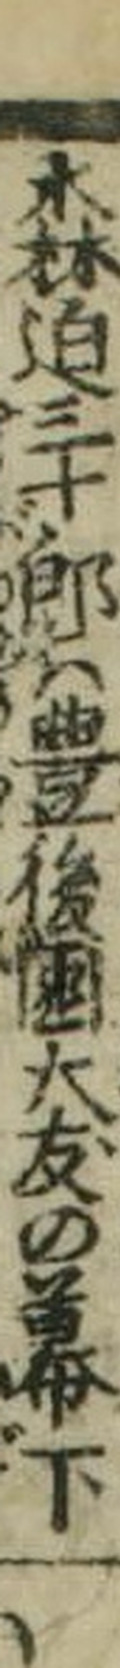森迫三十郎は豊後国大友の幕下
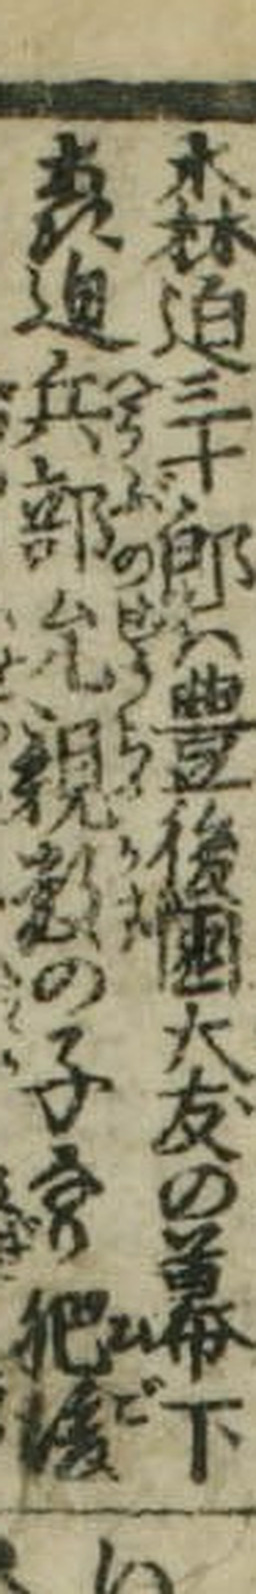森迫兵部允親数の子なり肥後
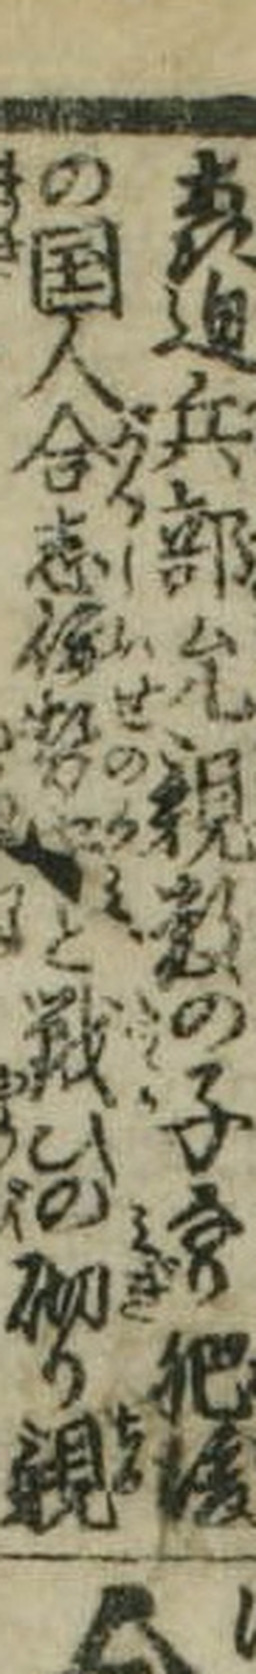の国人合志伊勢守と戦ひの砌り親
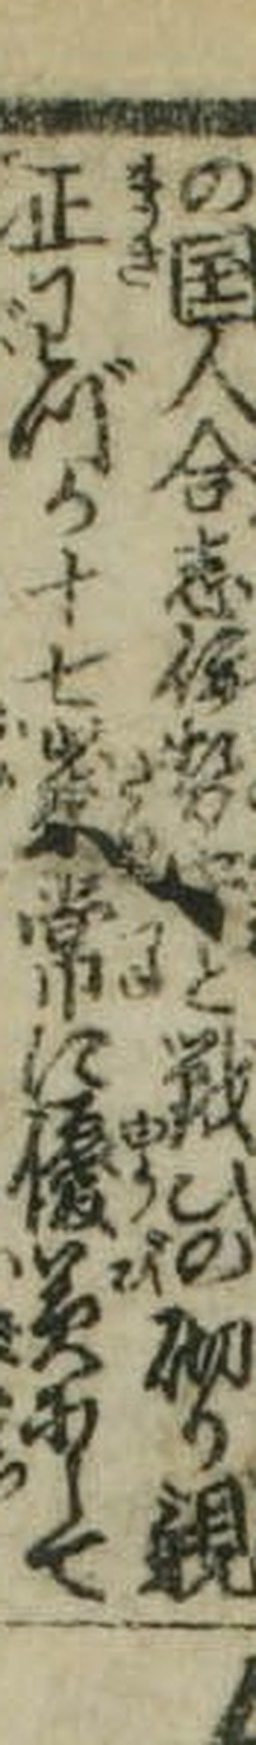正わづか十七歳常に優美にして
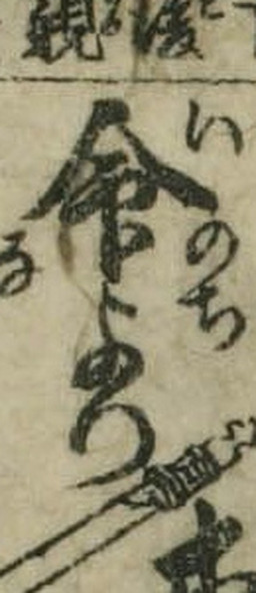命より
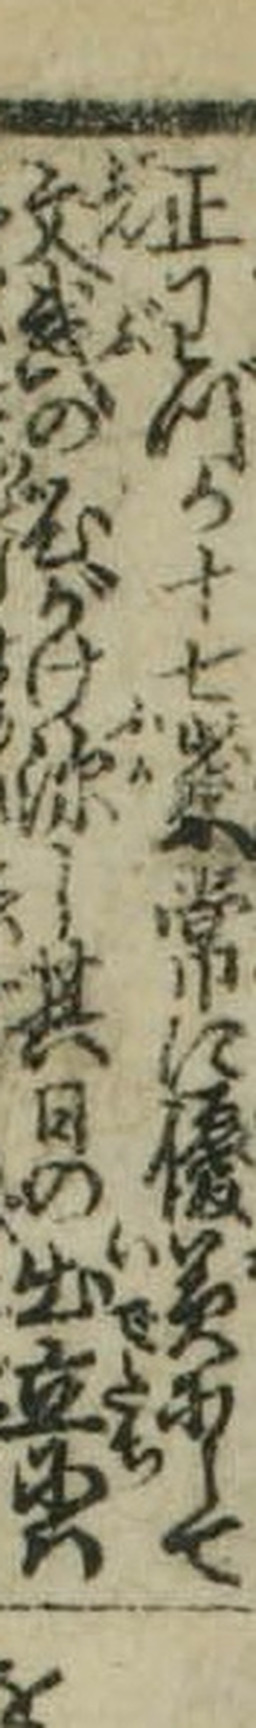文武の心がけ深し其日のし出立には
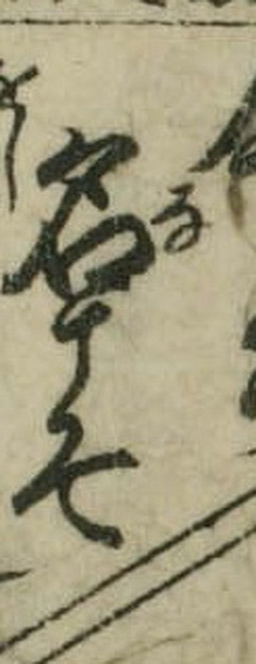名こそ
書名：續英雄百人一首
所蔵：東京学芸大学附属図書館
